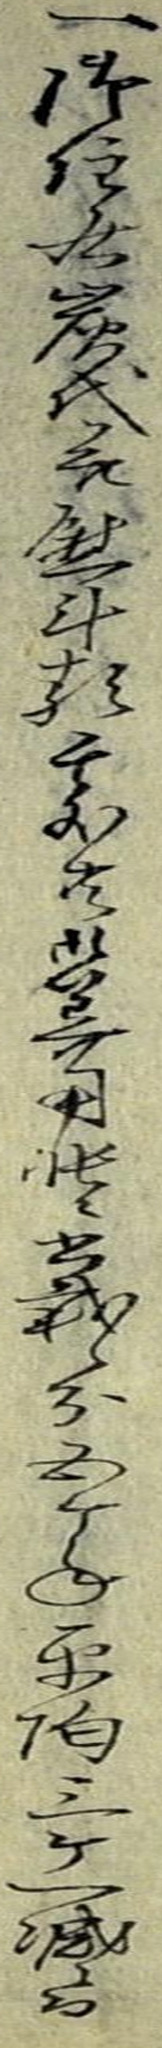廣一御住居炭代并熨斗類其外共御算用帳に書載候分五ヶ年平均三ヶ一減に而
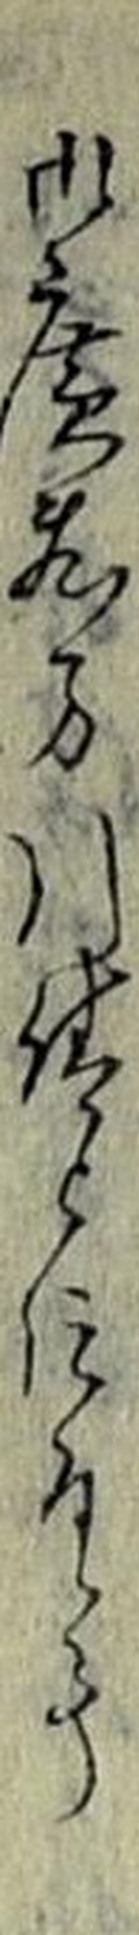御広敷方引請に被仰付候事
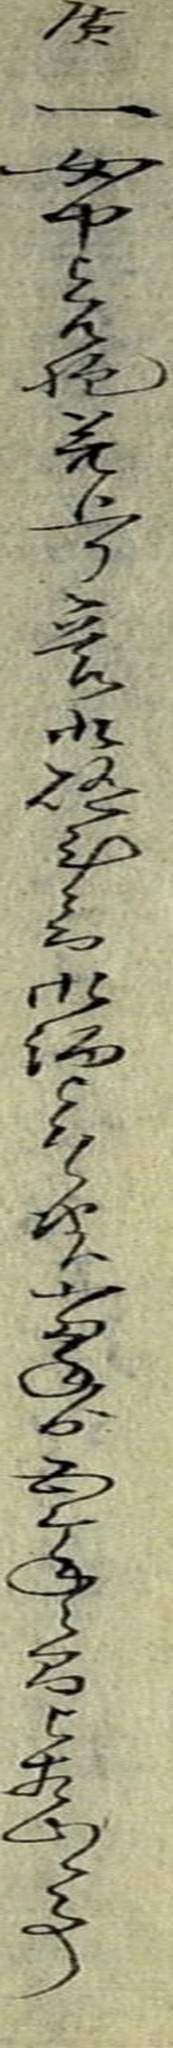廣一女中被召抱并上り候節御賄斗に而御酒被下候儀は当年ゟ五ヶ年之間被相止候事
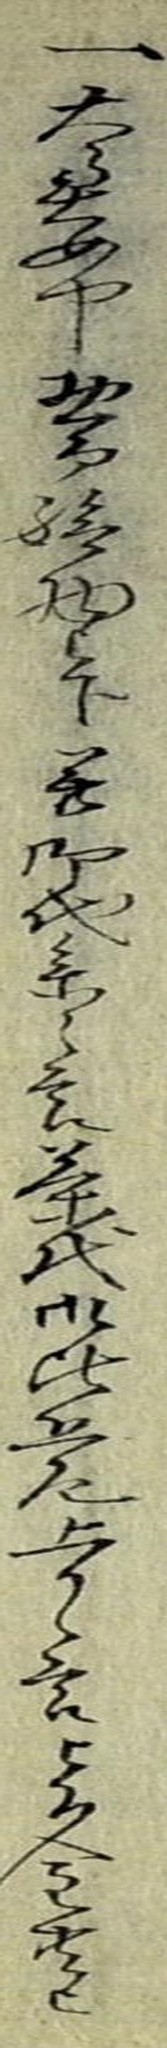廣一大奥女中惣而給物被下并御代参之節茶代御比丘尼上り候節被下金共被
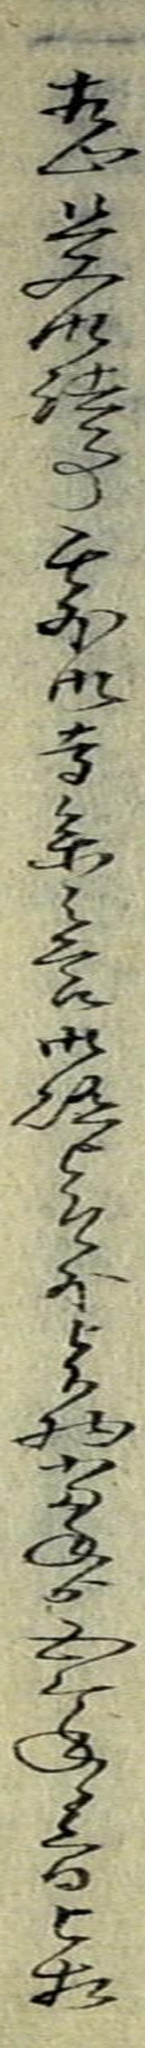相止且又御法事其外御寺参之節御賄被下候外被下物当年ゟ五ヶ年之間被相
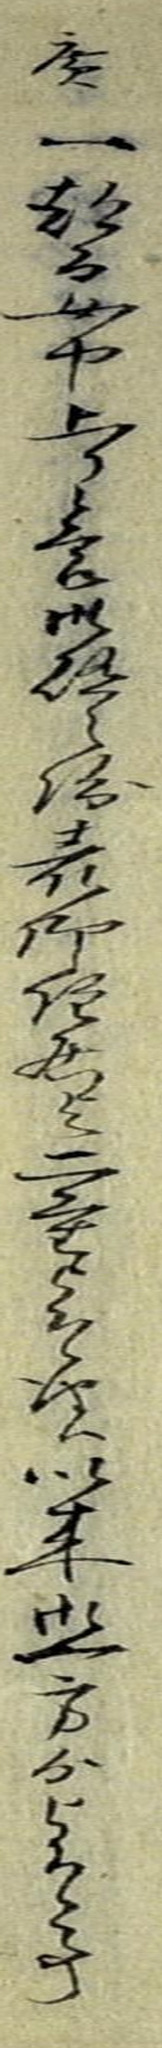廣一都而女中上り候節御賄之儀表御住居と二重被下候儀は以来御一方分被下候事
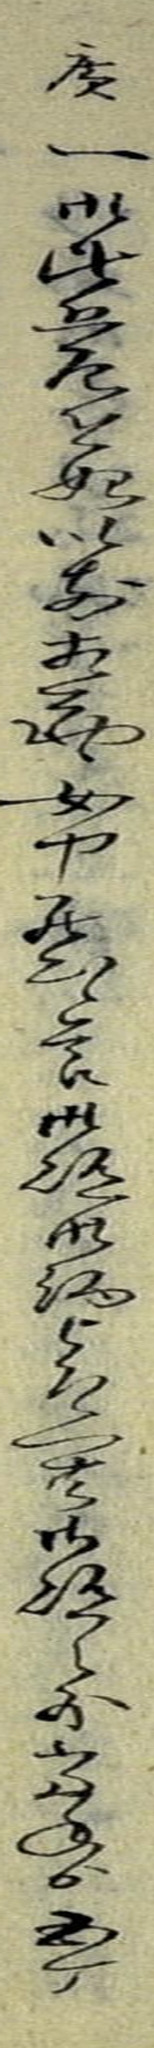廣一御比丘尼を始以前相勤候女中罷出候節御賄御酒被下候へ共御賄之外当年ゟ五ヶ
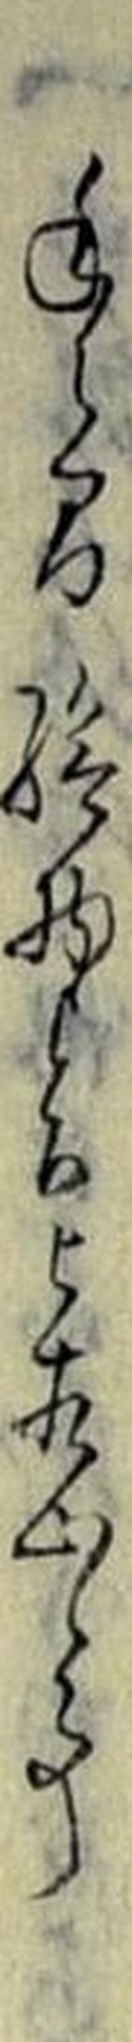年之間給物被下被相止候事
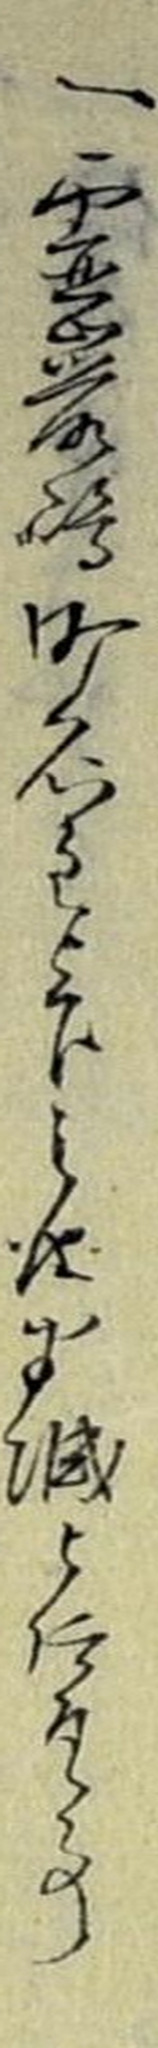一霊岸嶋町名主被下候儀半減被仰付候事
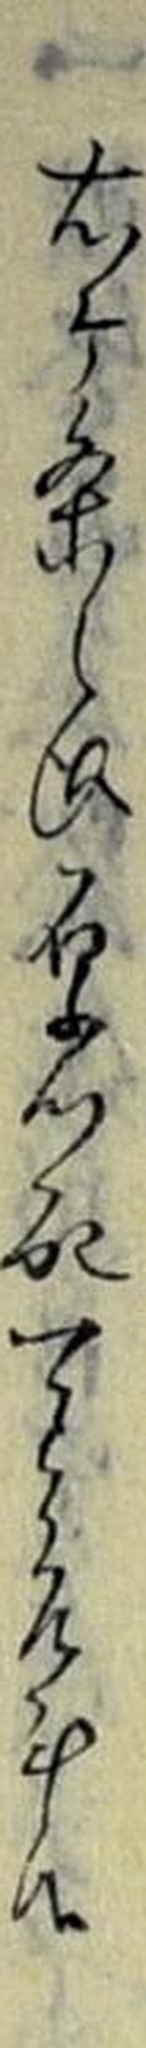右ヶ条之趣厚心配可被取斗候
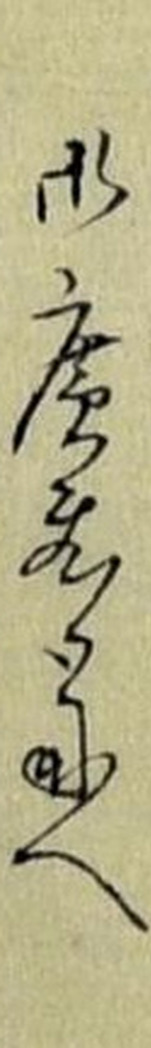御広敷御用人
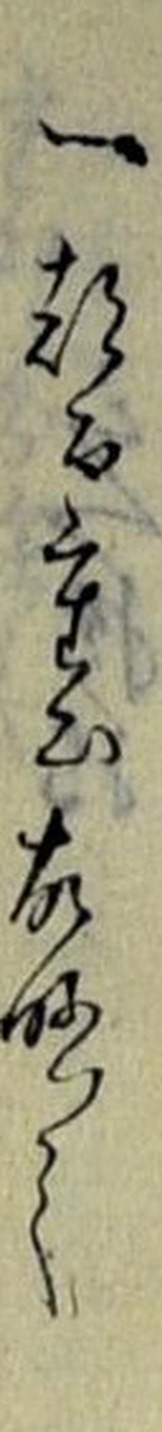一都而重出故略之
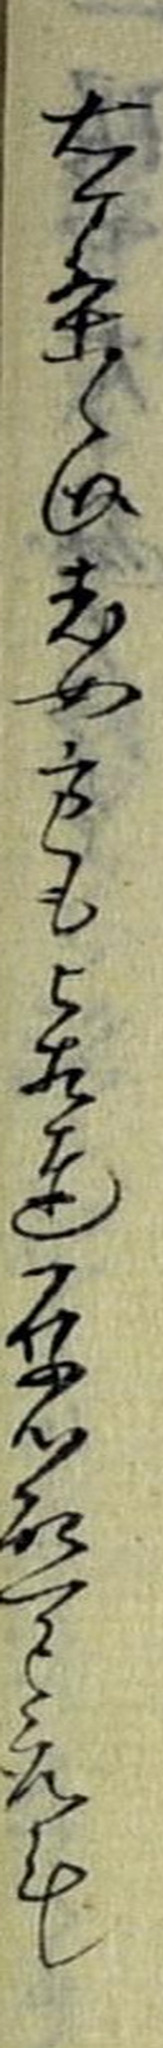右ヶ条之趣老女方へも被相達厚心配可被取斗候
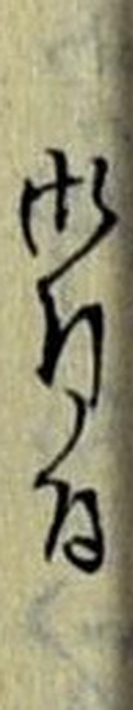御目付
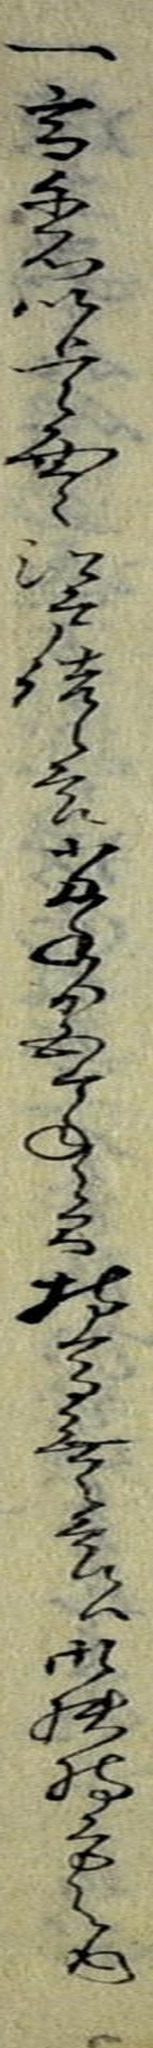一高千石以上之面々江戸詰之節当年ゟ五ヶ年之間持馬無之節は御扶持方之内
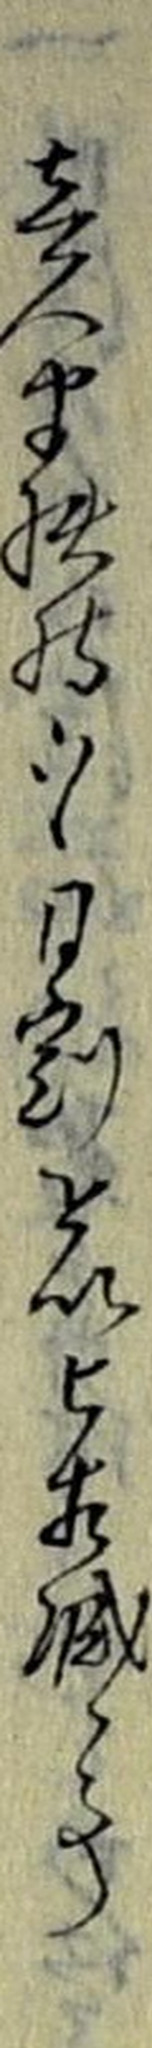壱人半扶持つヽ月割を以被相減候事
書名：命令之部 六
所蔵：福井県文書館 Fukui Prefectural Archives
